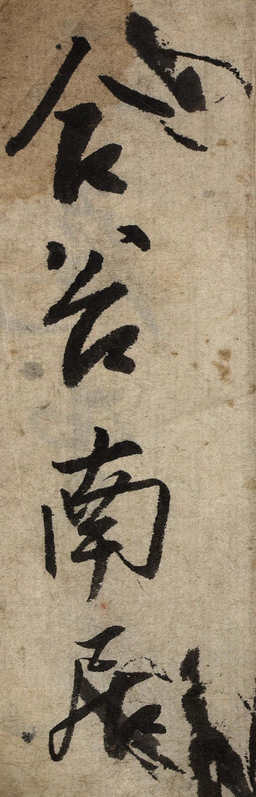合谷南居

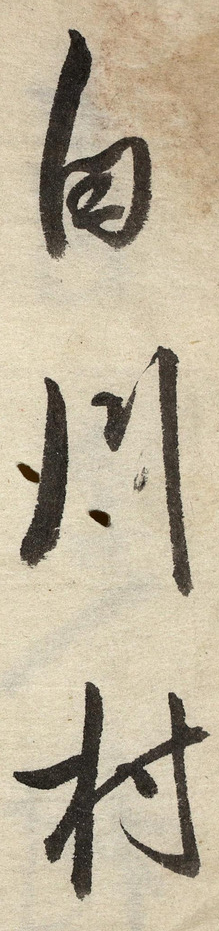白川村
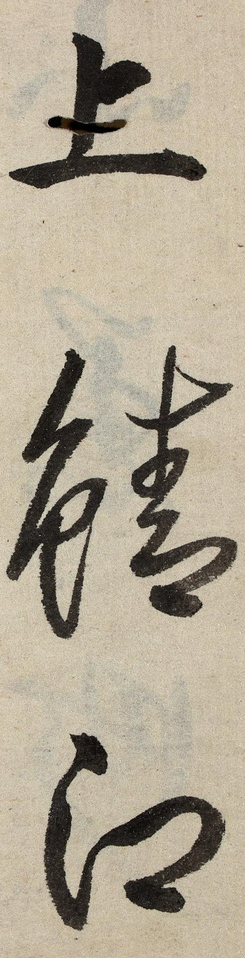上鯖江
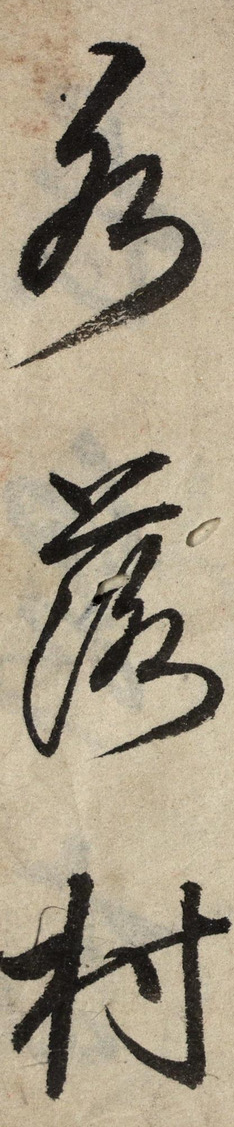水落村

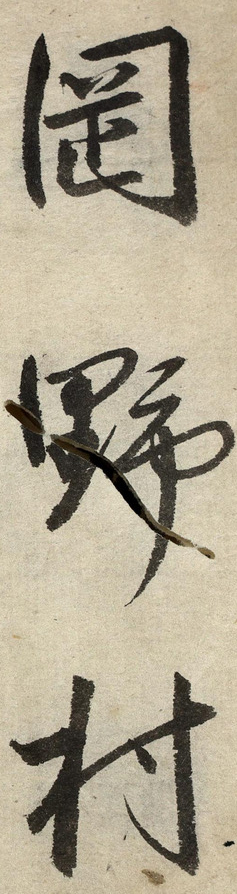岡野村
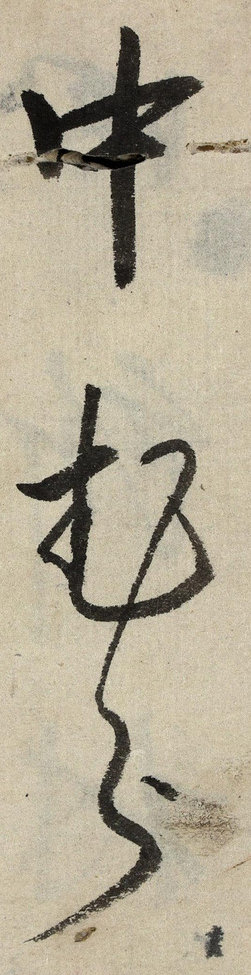中むら
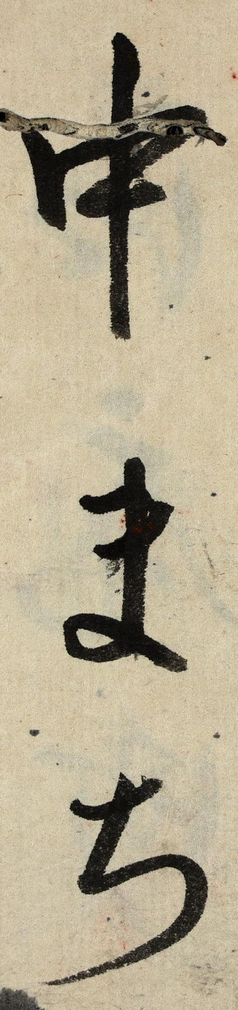中まち
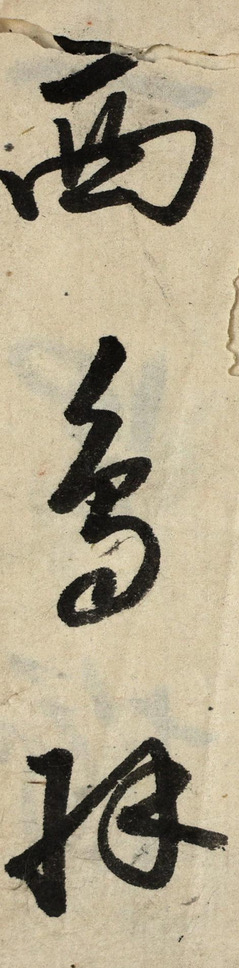西鳥羽

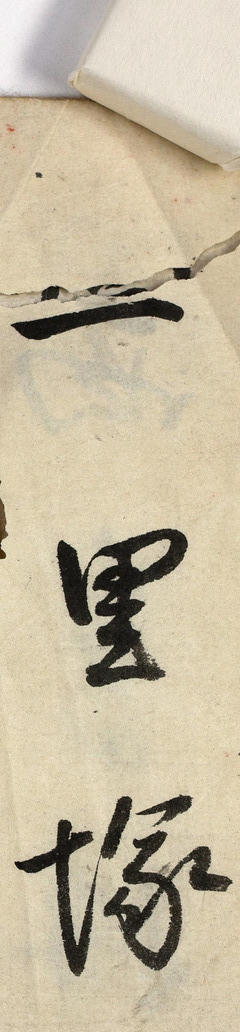一里塚
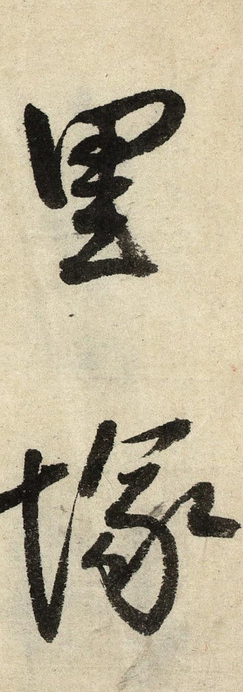一里塚
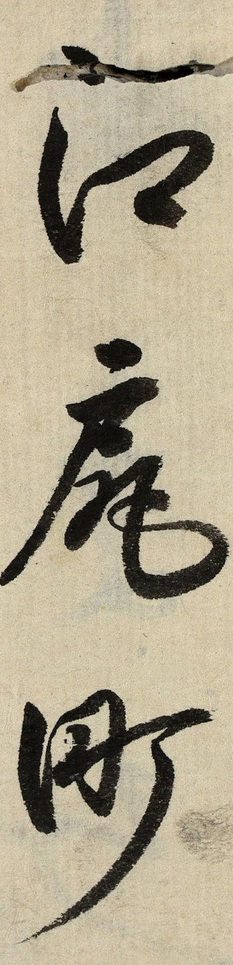江尻町
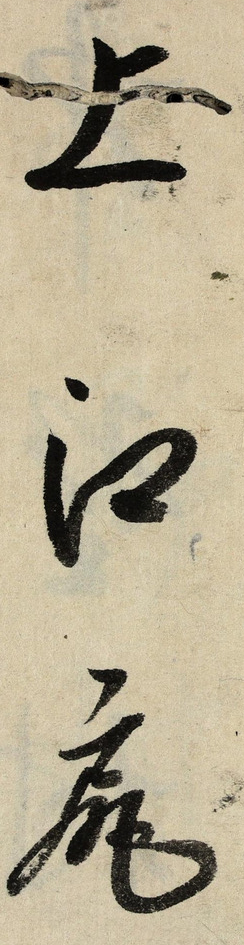上江尻
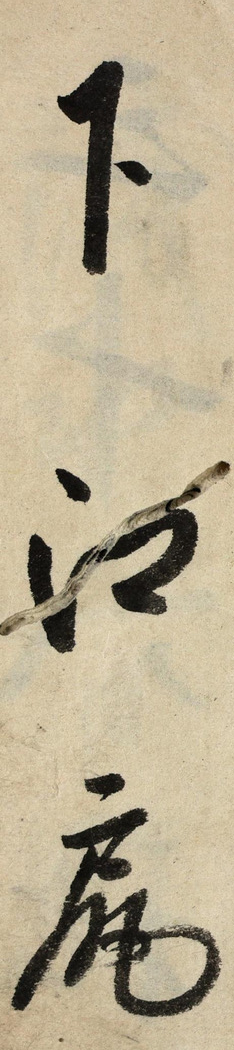下江尻

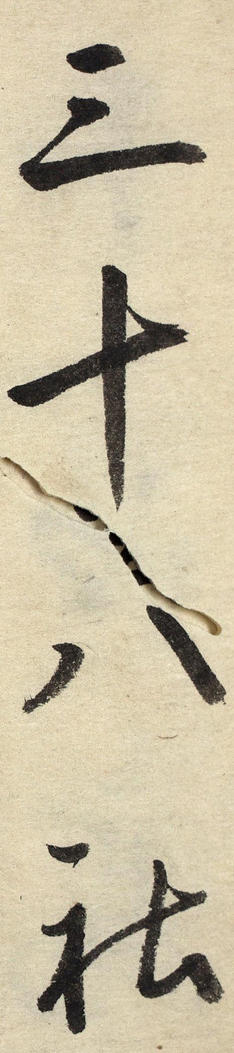三十八社
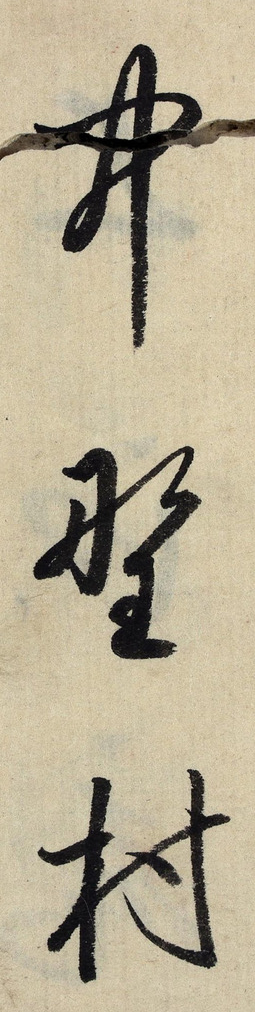中野村
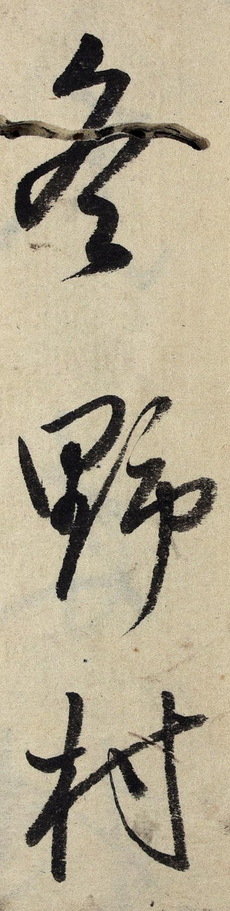冬野村
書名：村尽（合谷・南居・三尾野等村々、敦賀県・足羽県等、受取等例文…
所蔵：福井県文書館 Fukui Prefectural Archives
